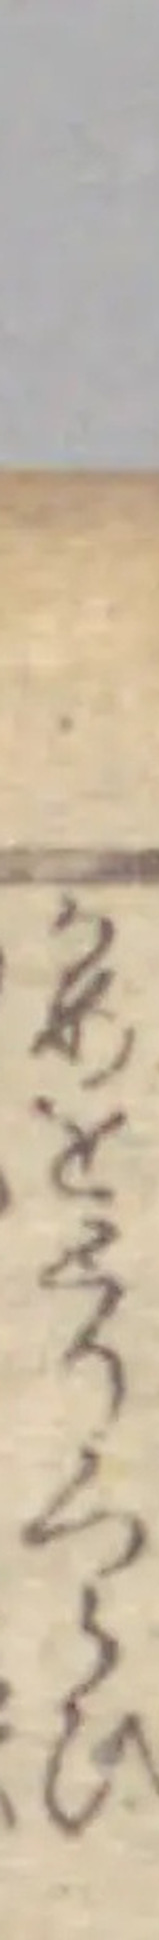かめをとりくらひ
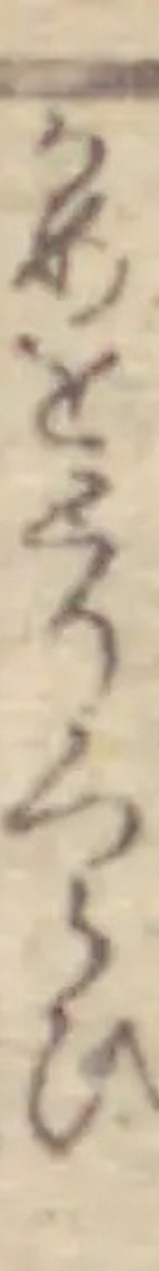かめをとりくらひ
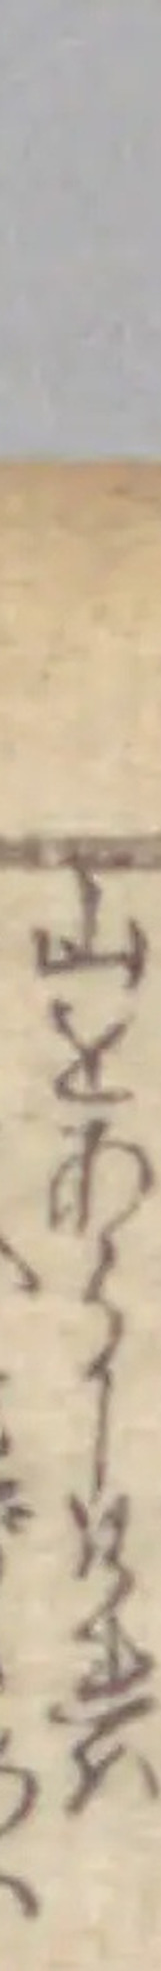山をあらしけれは
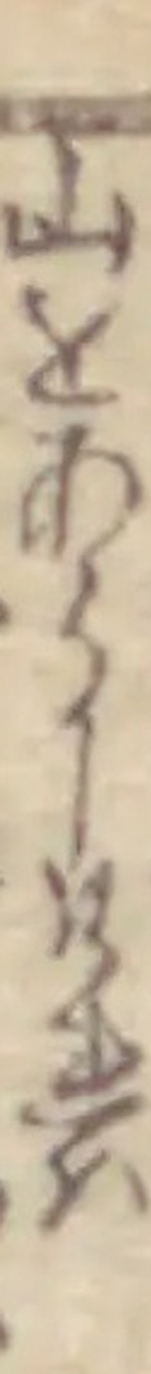山をあらしけれは
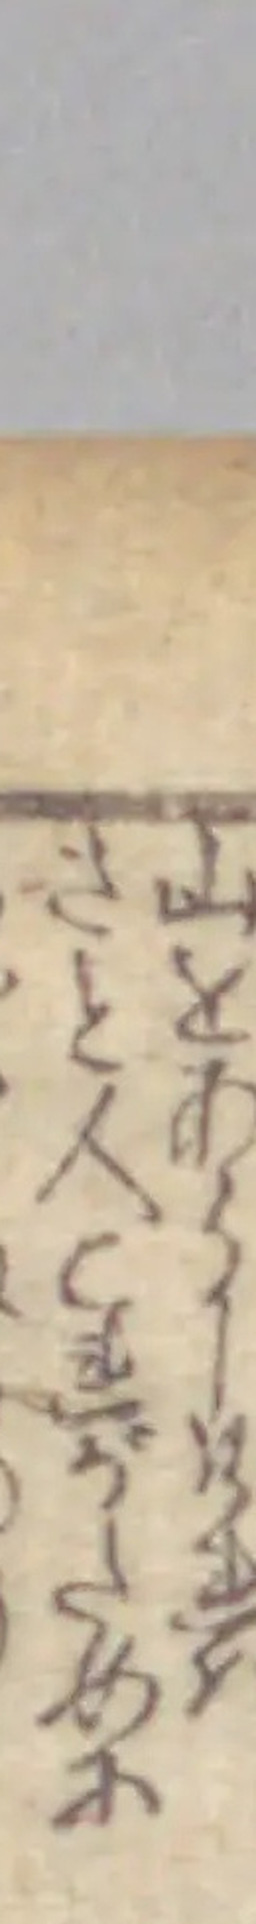さと人これがために
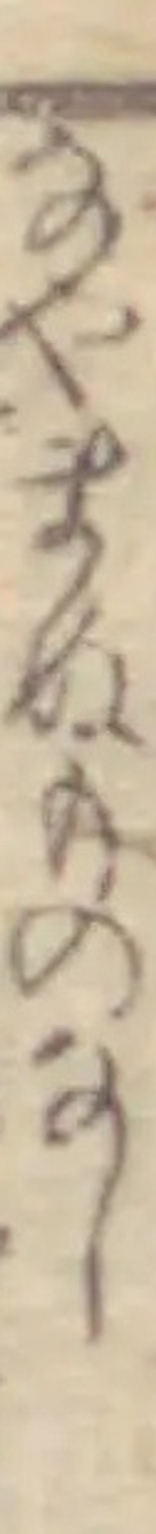なやまぬものなし
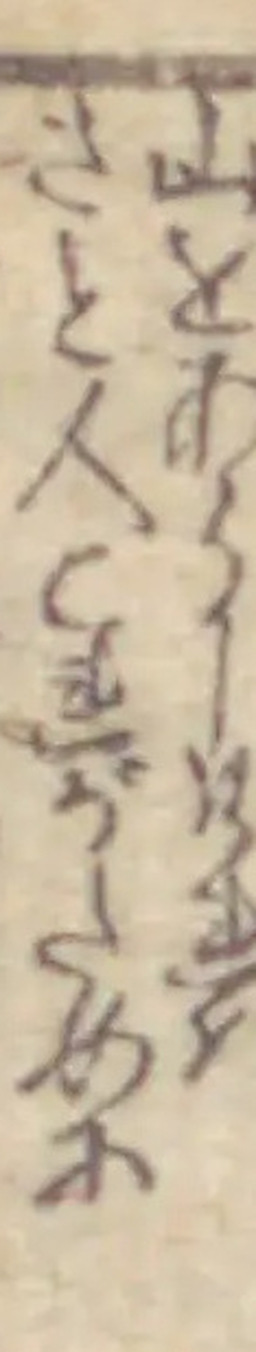さと人これがために
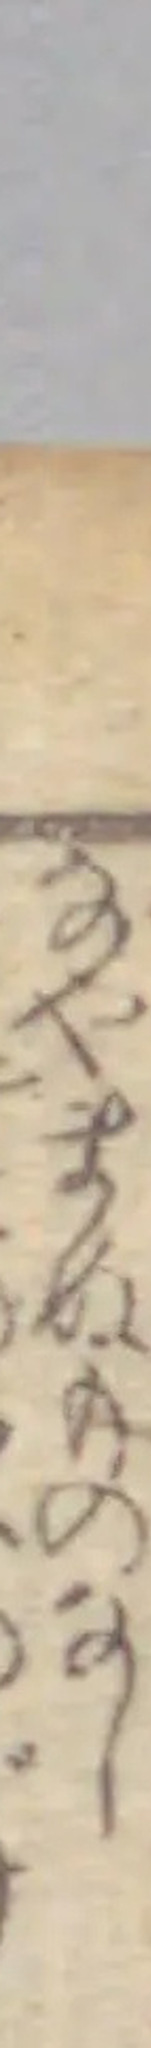なやまぬものなし
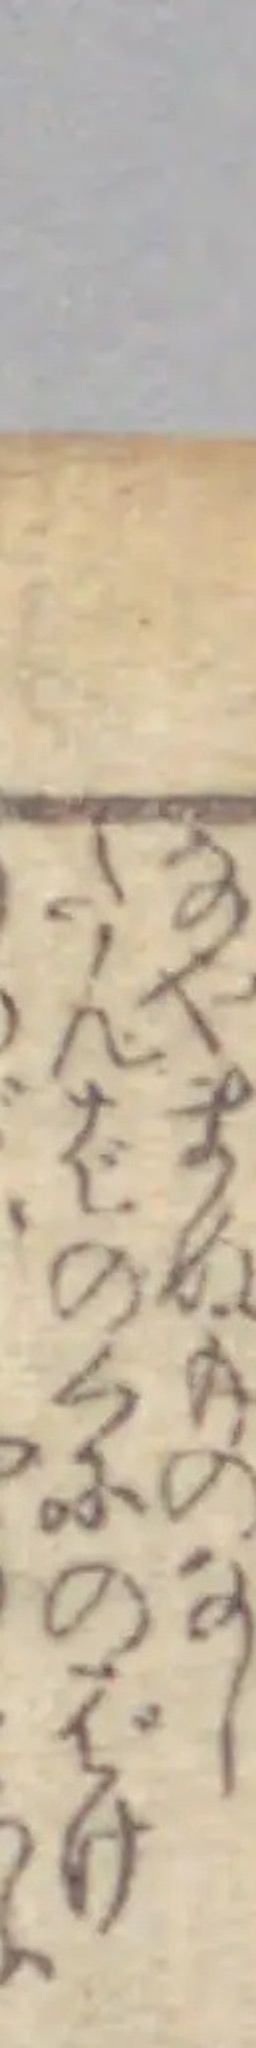たんばのくにのばけ
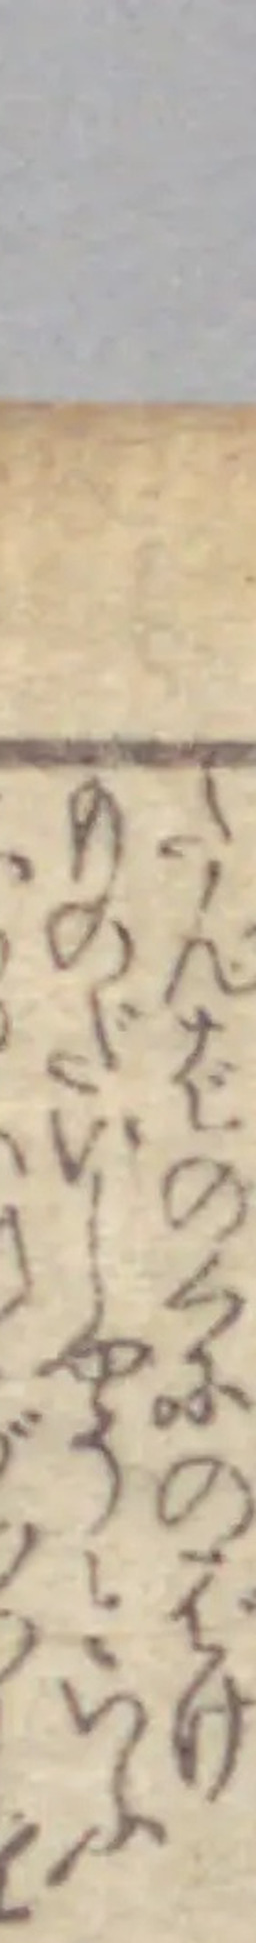ものだいしやうといふ
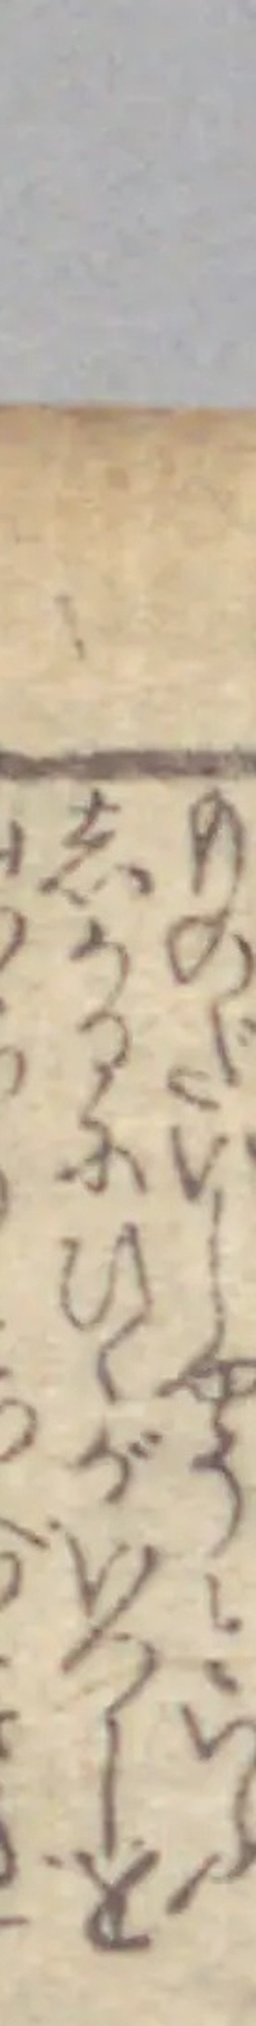しかるにひゝがいつしを
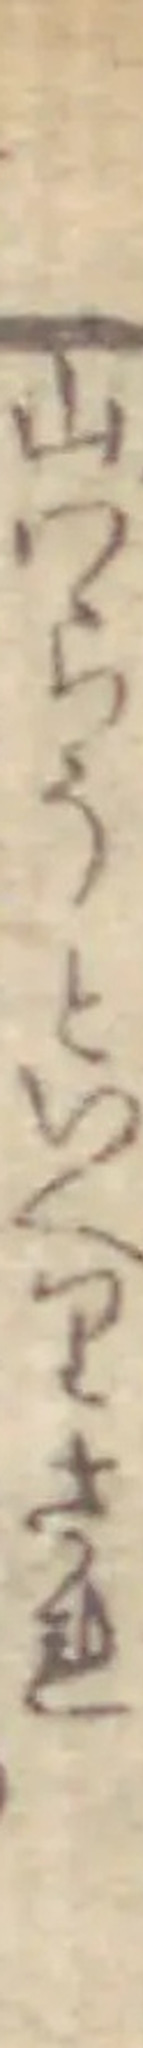山わらうといへりされ
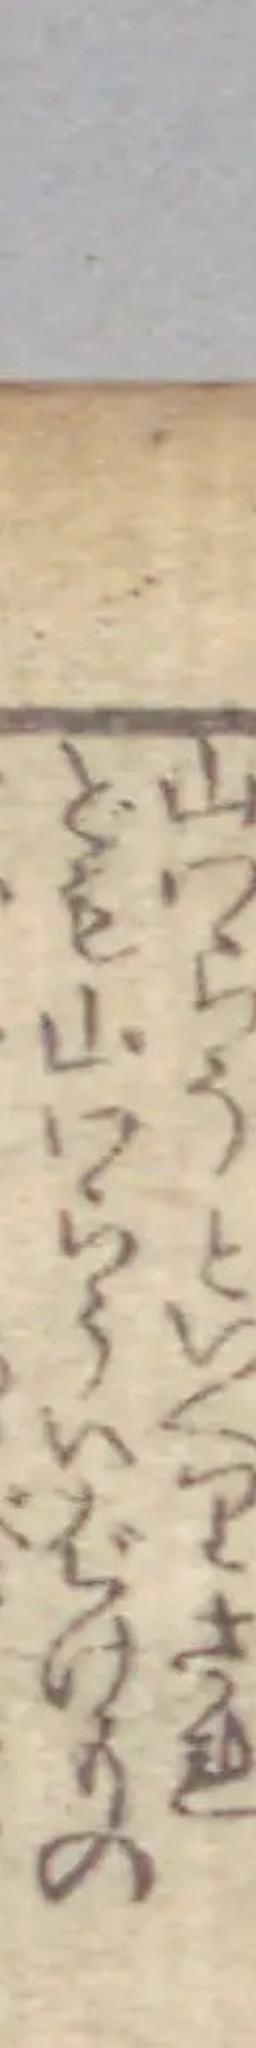ども山わらうはばけもの
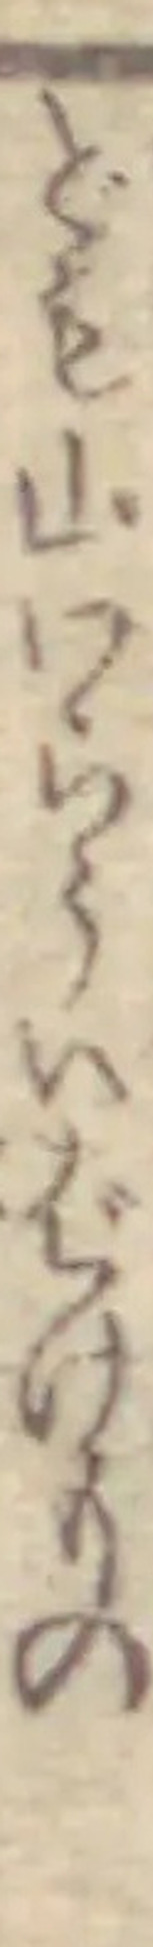ども山わらうはばけもの
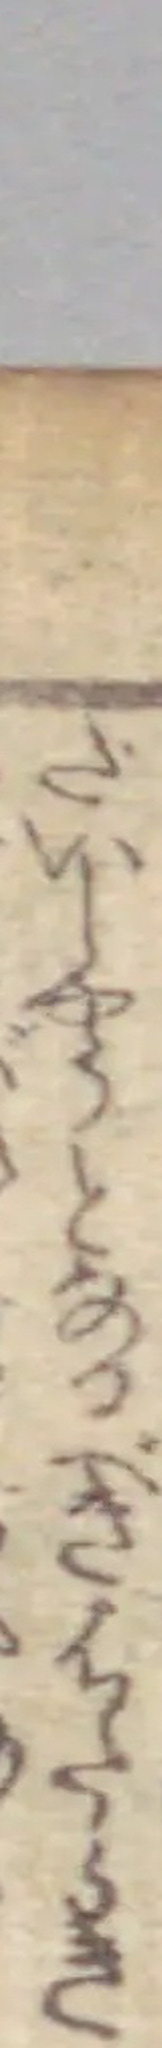だいしやうとなるべきはたらき
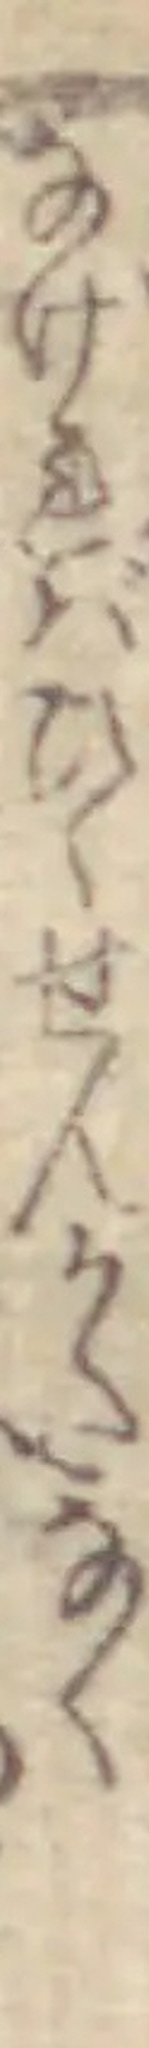なければひゝせんかたなく
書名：大昔化物双紙 2巻
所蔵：国立国会図書館 National Diet Library, JAPAN
